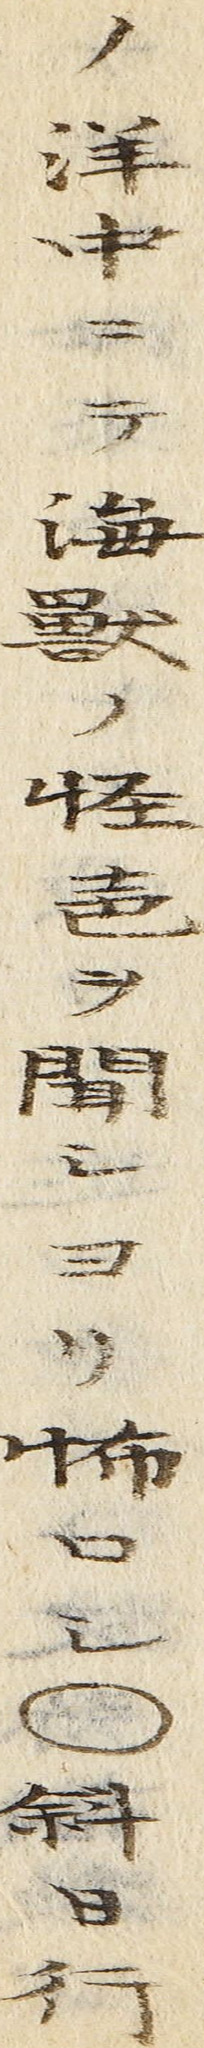ノ洋中ニテ海獣ノ怪声ヲ聞シヨリ怖ロシ◯斜日行
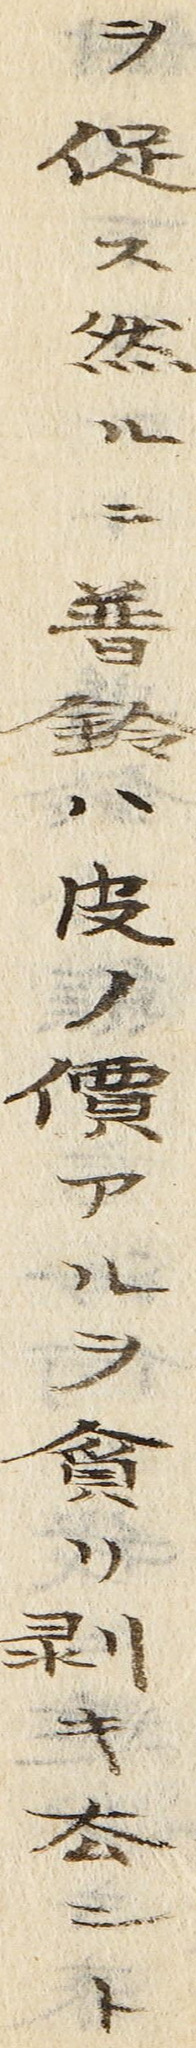ヲ促ス然ルニ普鈴ハ皮ノ価アルヲ貪リ剥キ去ント
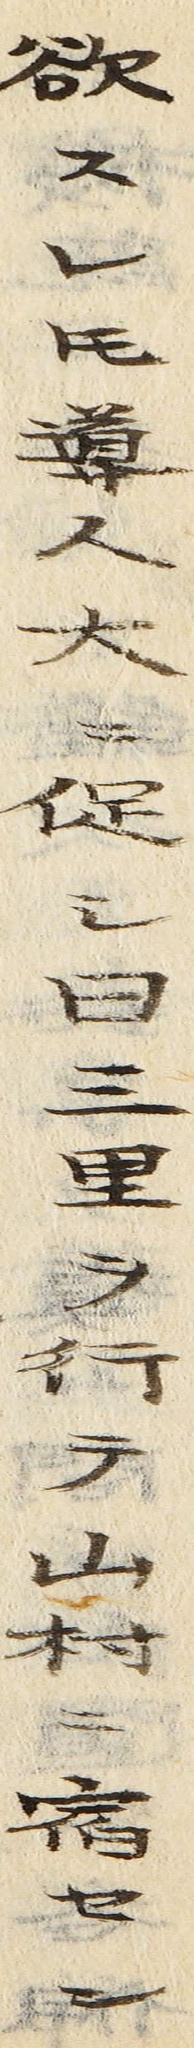欲スレトモ導人大ニ促シ曰三里ヲ行テ山村ニ宿セン
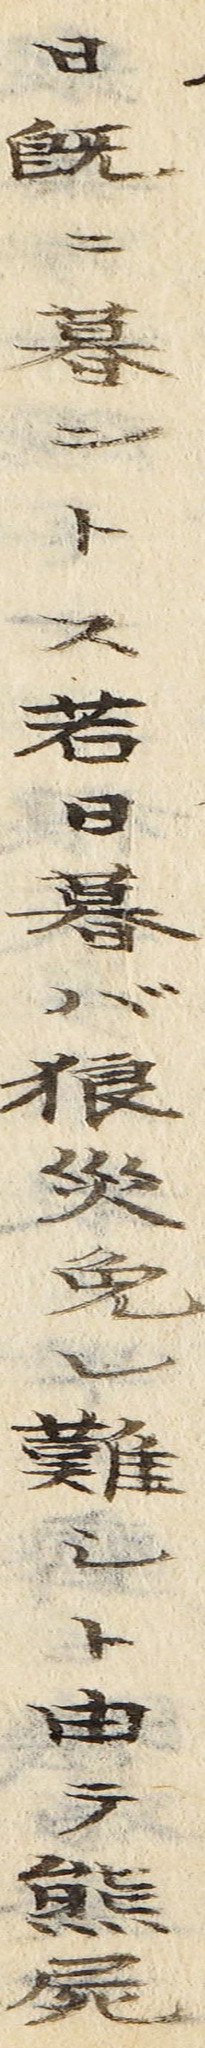日既ニ暮ントス若日暮バ狼災免レ難シト由テ熊屍
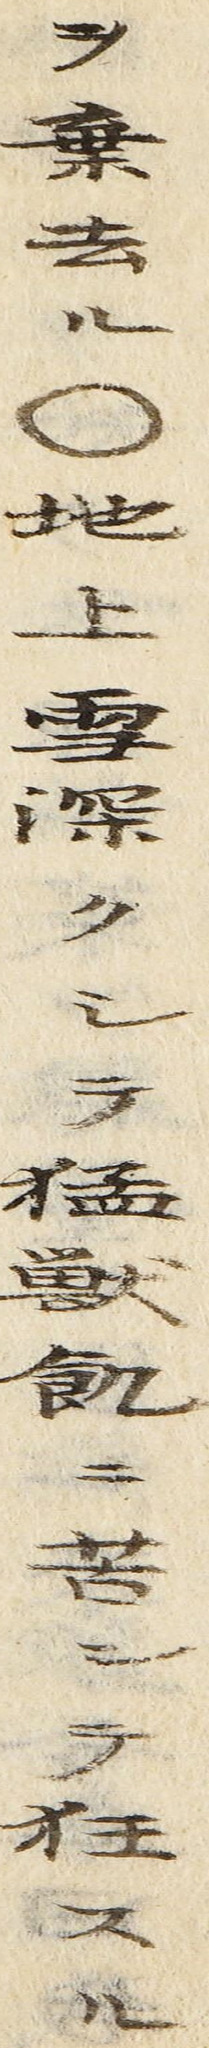ヲ棄去ル◯地上雪深クシテ猛獣飢ニ苦ンテ狂スル
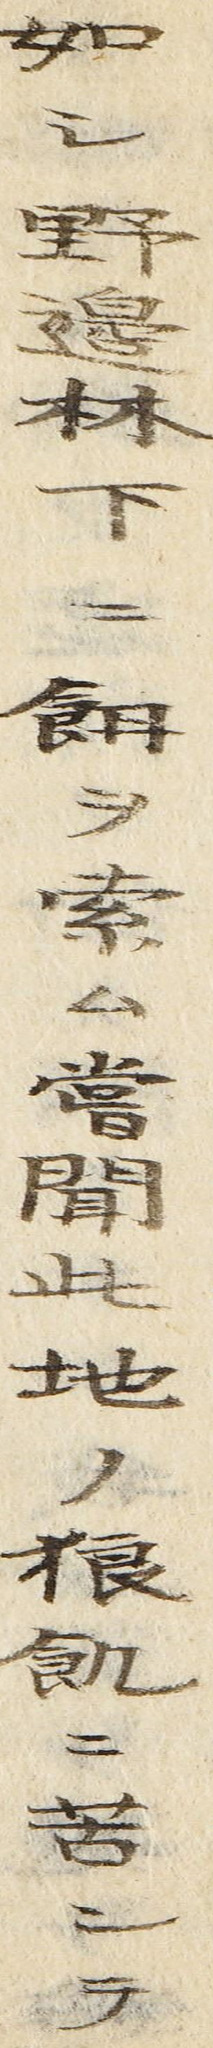如シ野辺林下ニ餌ヲ索ム嘗聞此地ノ狼飢ニ苦ンテ
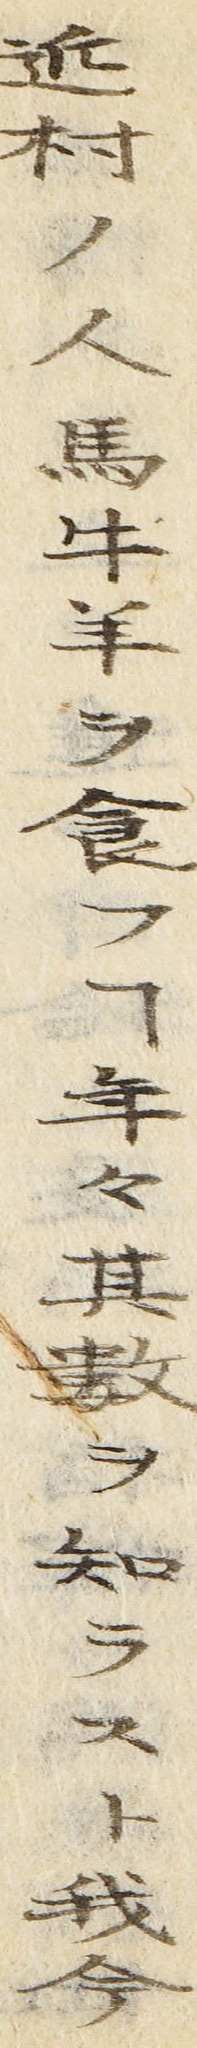近村ノ人馬牛羊ヲ食フコト年々其数ヲ知ラスト我今
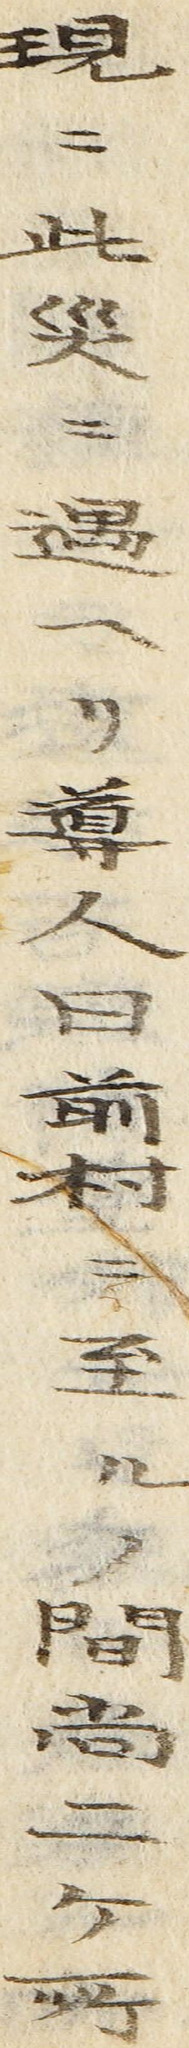現ニ此災ニ遇ヘリ導人曰前村ニ至ルノ間尚二ケ所
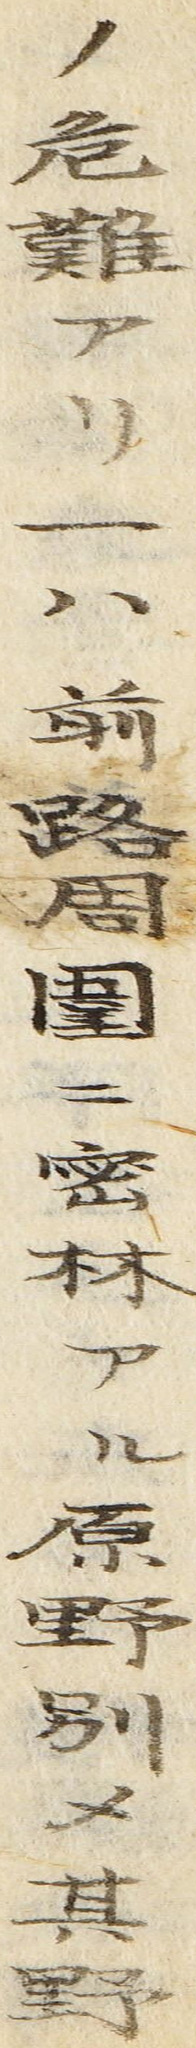ノ危難アリ一ハ前路周囲ニ密林アル原野別シテ其野
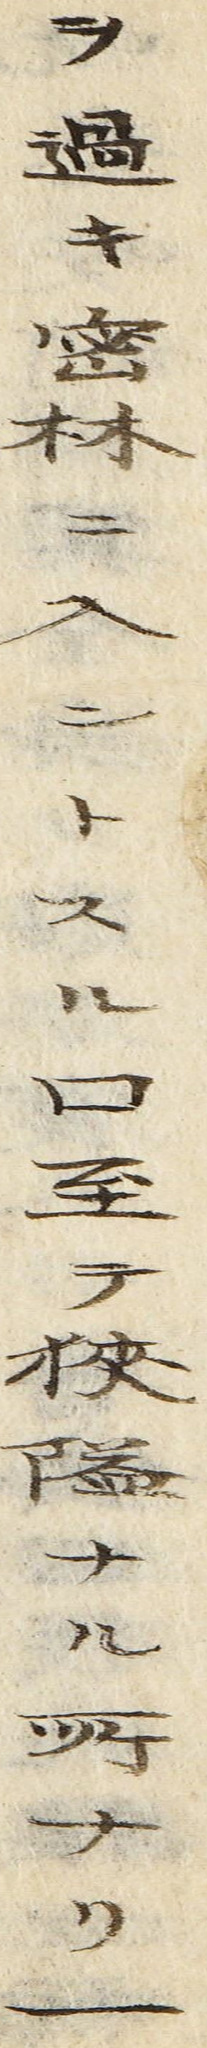ヲ過キ密林ニ入ントスル口至テ狭隘ナル所ナリ一
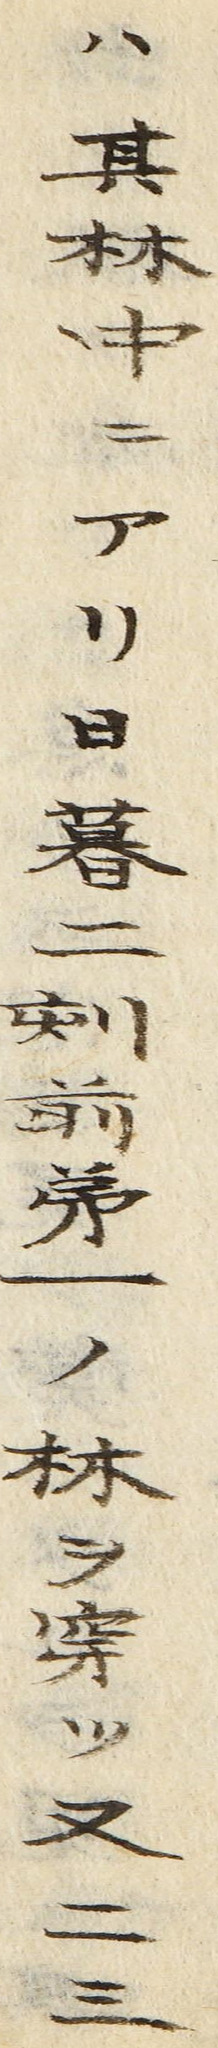ハ其林中ニアリ日暮二刻前第一ノ林ヲ穿ツ又二三
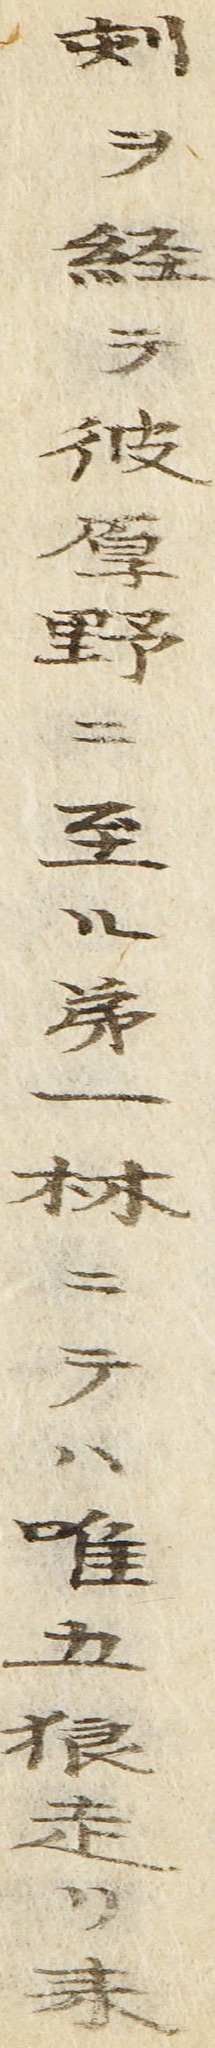刻ヲ経テ彼厚野ニ至ル第一林ニテハ唯五狼走リ来
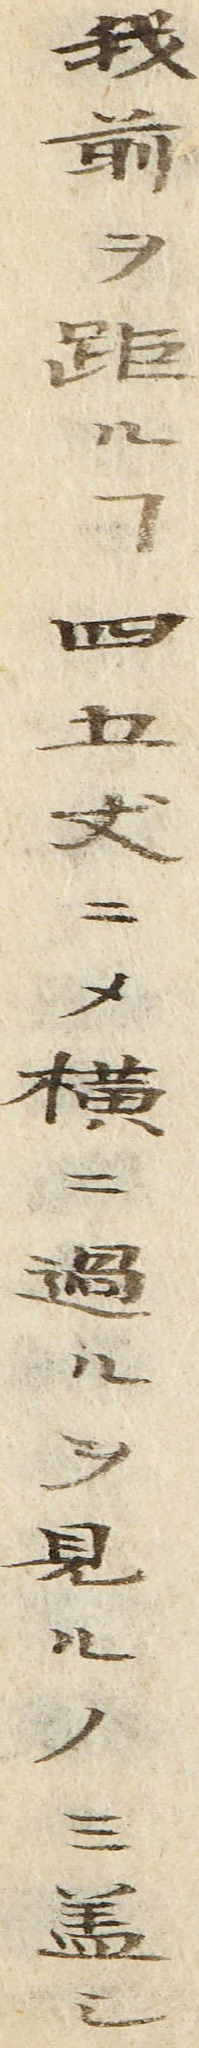我前ヲ距ルコト四五丈ニシテ横ニ過ルヲ見ルノミ蓋シ

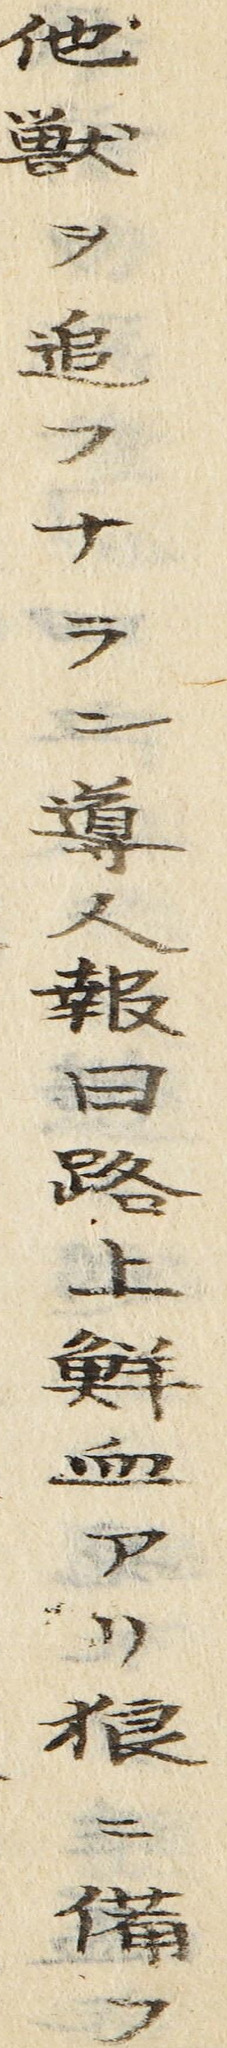他獣ヲ追フナラン導人報曰路上鮮血アリ狼ニ備フ
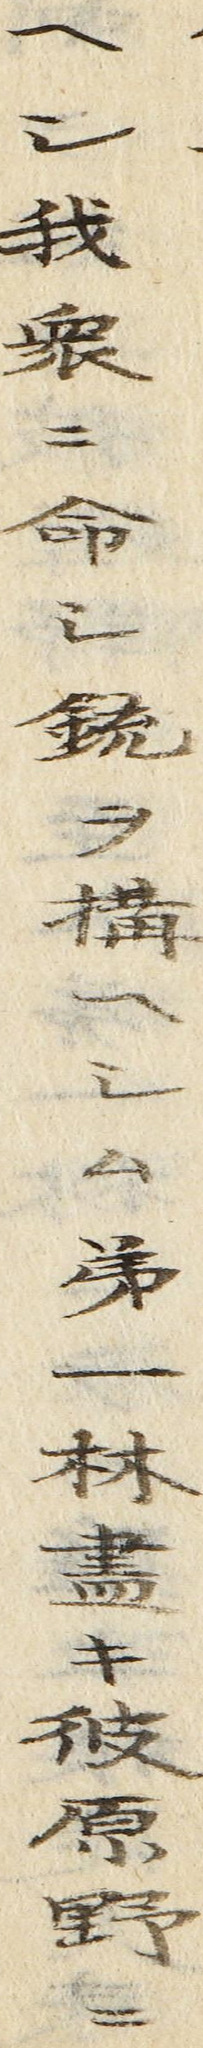ヘシ我衆ニ命シ銃ヲ搆ヘシム第一林尽キ彼原野ニ
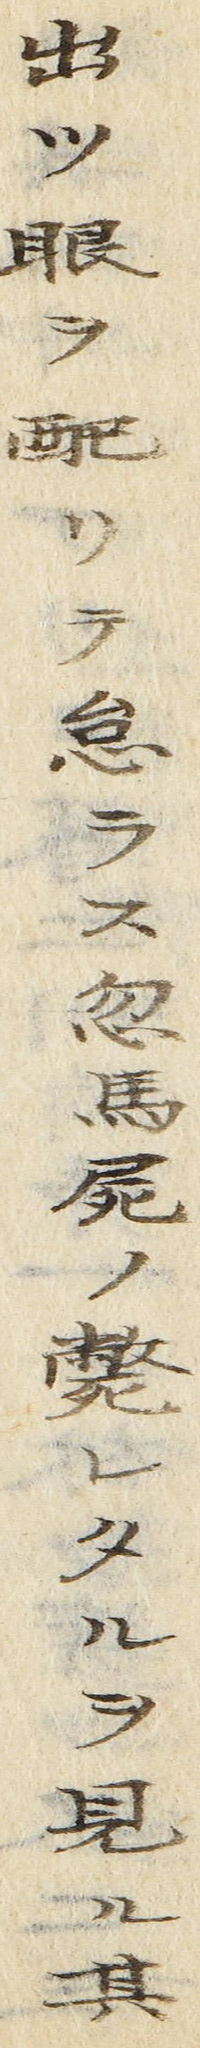出ツ眼ヲ配リテ怠ラス忽馬屍ノ斃レタルヲ見ル其
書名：漂流紀事
